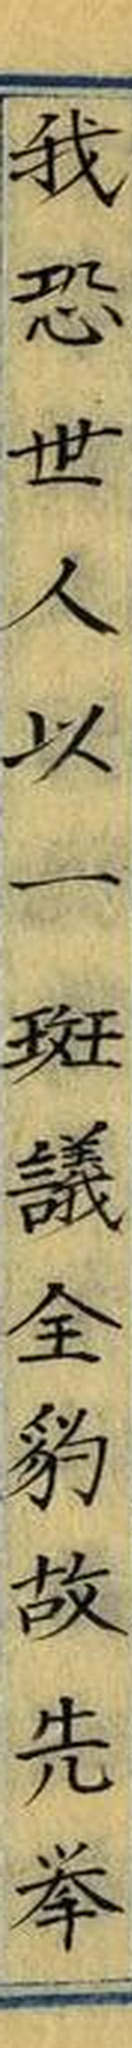我恐世人以一班議全豹故先挙
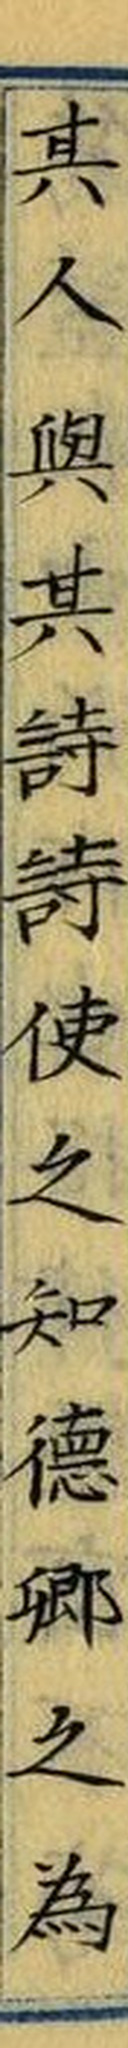其人與其詩詩使之知德卿之為
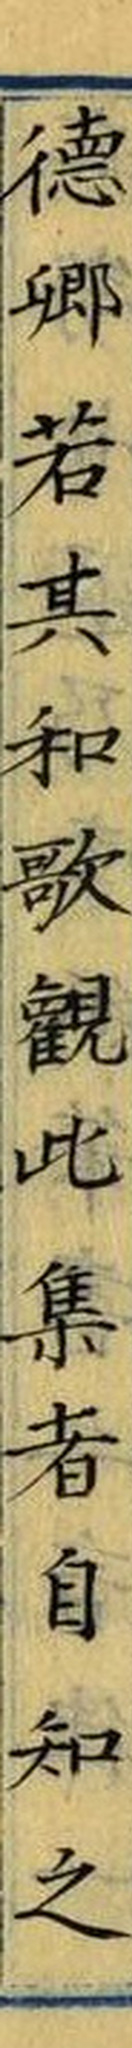德卿若其和歌觀此集者自知之
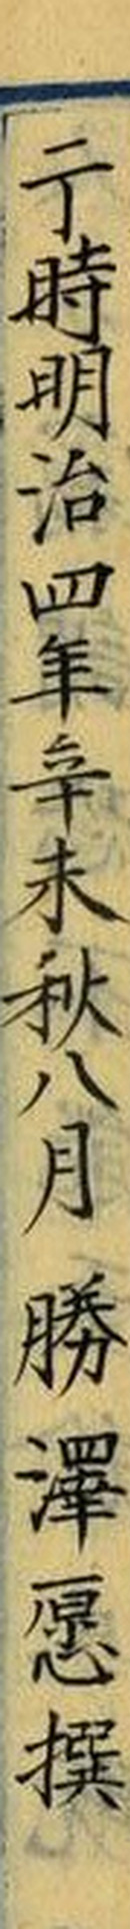亍時明治四年辛未秋八月勝澤愿撰
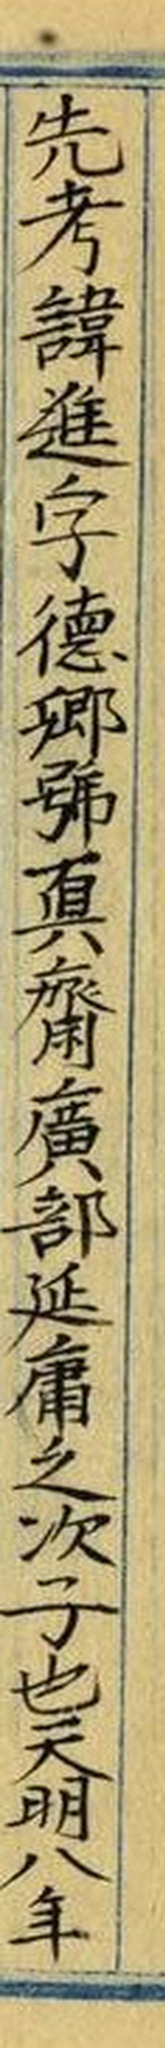先考諱進字德卿號眞齋廣部延庸之次子也天明八年
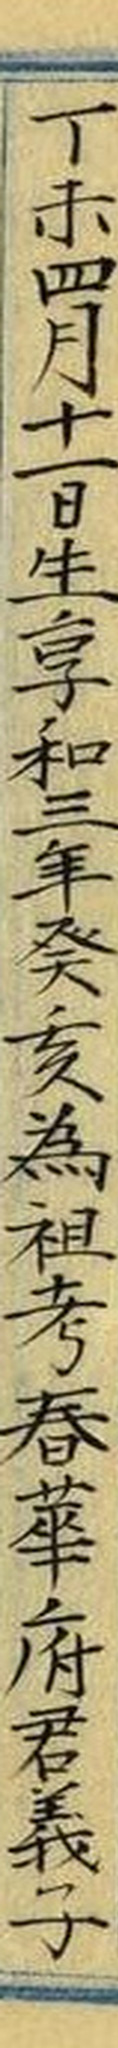丁未四月十一日生享和三年癸亥為祖考春蕐府君義子
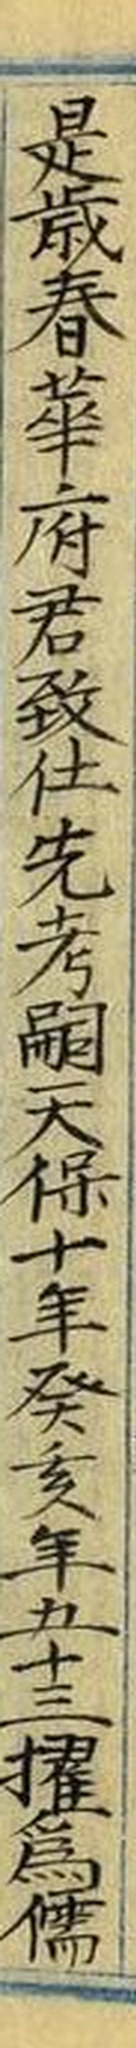是歳春蕐府君致仕先考嗣天保十年癸亥年五十三擢爲儒
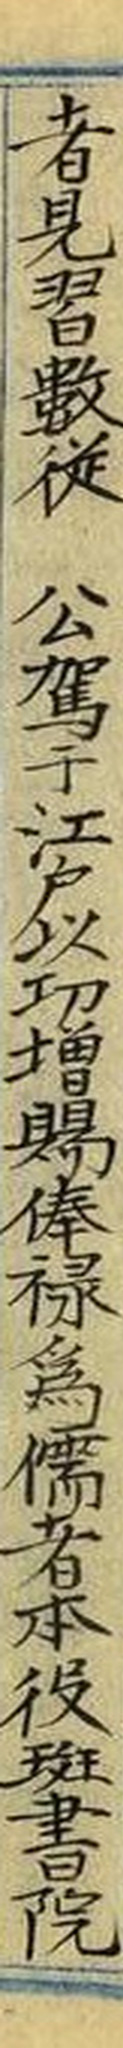者見習數従公駕于江戸以㓛増賜俸禄爲儒者本役班書院
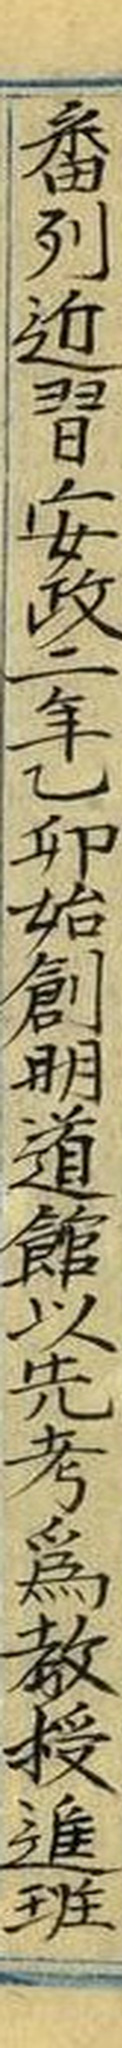番列近習安政二年乙卯始創明道館以先考爲教授進班
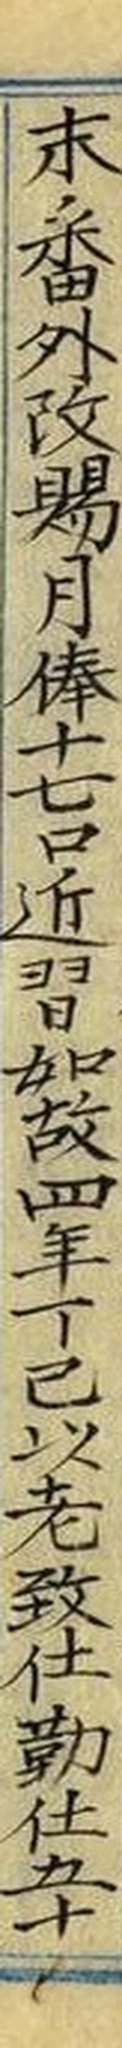末番外改賜月俸十七口近習如故四年丁巳以老致仕勤仕五十
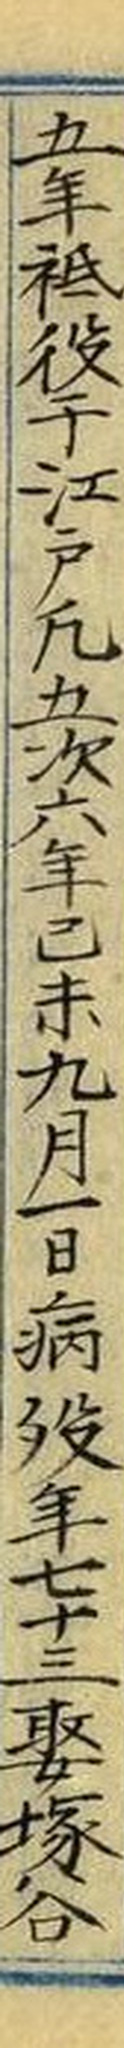五年祗役于江戸凢五次六年己未九月一日病殁年七十三娶塚谷
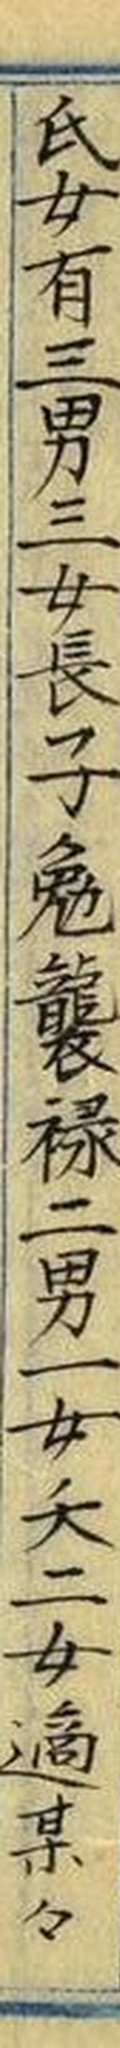氏女有三男三女長子勉襲禄二男一女夭二女適某々

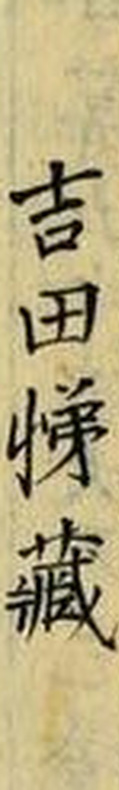吉田悌藏
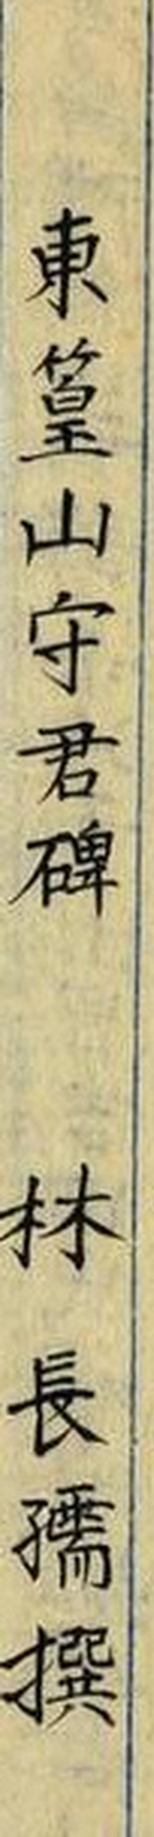東篁山守君碑林長孺撰
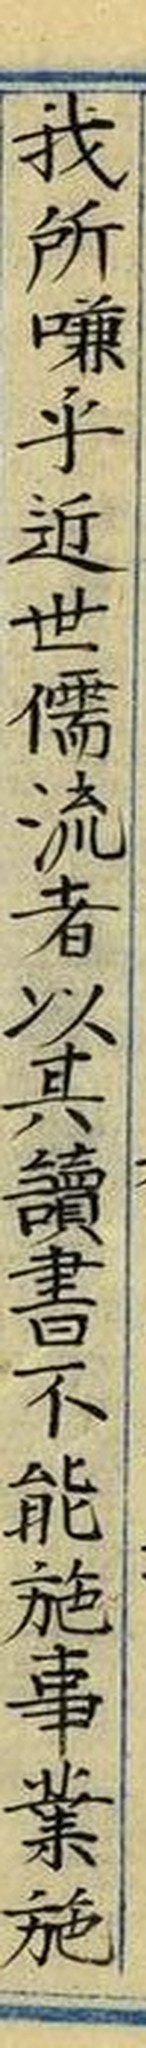我所嗛乎近世儒流者以其讀書不能施事業施
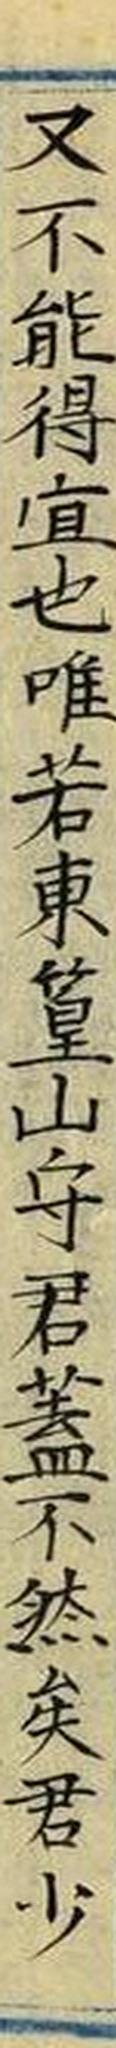又不能得宜也唯若東篁山守君蓋不然矣君少
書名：温古集 四巻
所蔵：福井県文書館 Fukui Prefectural Archives
